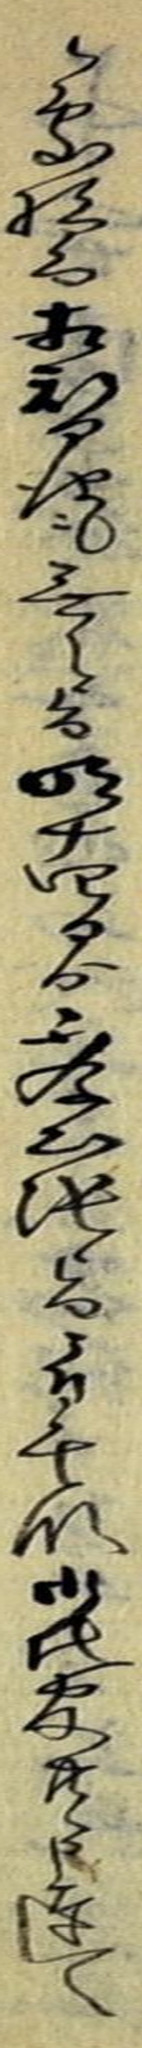候処指而相替儀も無之旨明十四日ゟ不及出張旨に付其段御代官共へ申達之
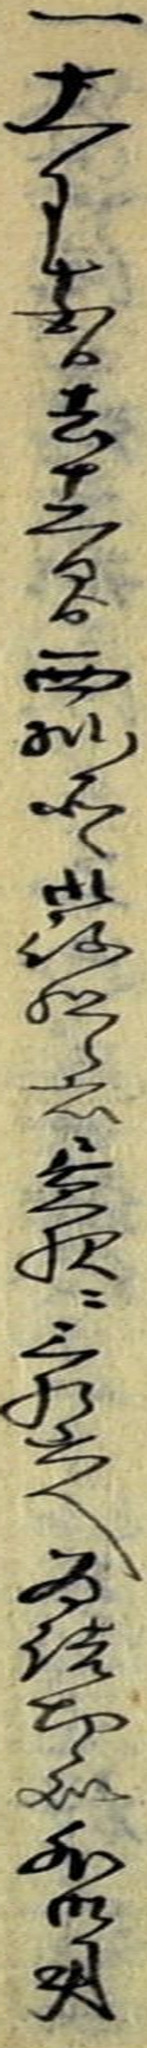一十一月十五日去十二日ゟ西掛所へ御役組之者昼夜に三拾六人為詰切候所外御用
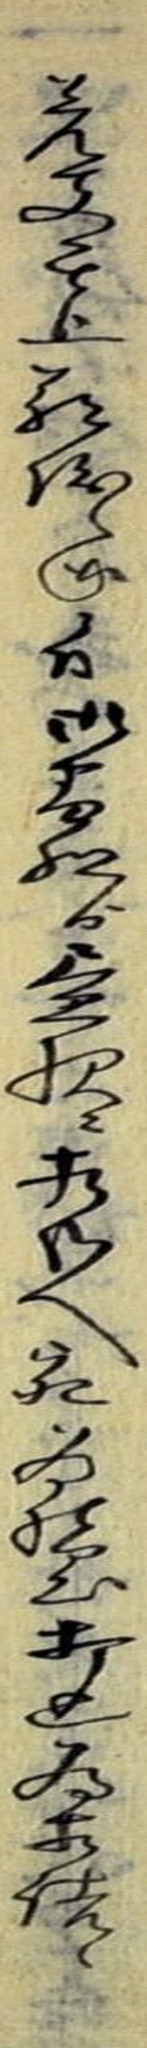差支其上難儀之趣に付御番組ゟ昼夜に拾弐人宛為指出打込為相詰候
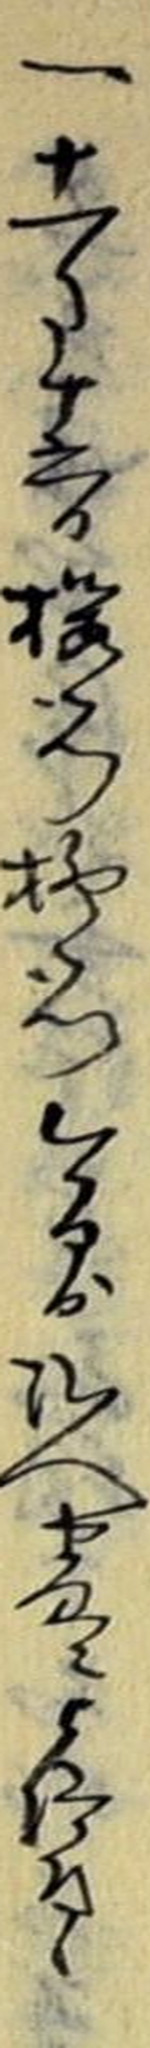一十一月十六日桜御門柳御門今日ゟ弐人番に被仰付候
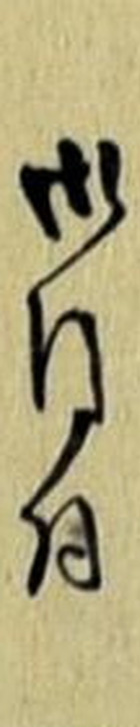御目付
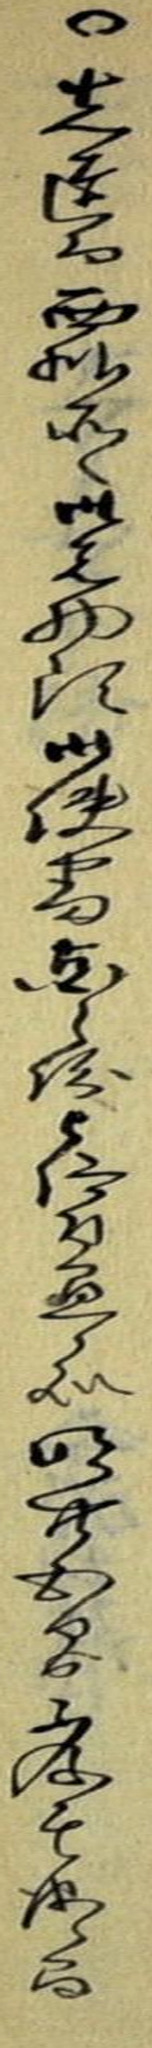○先達而西掛所へ御先物頭御使番固之儀被仰付置候所明廿五日ゟ不及其儀侯間
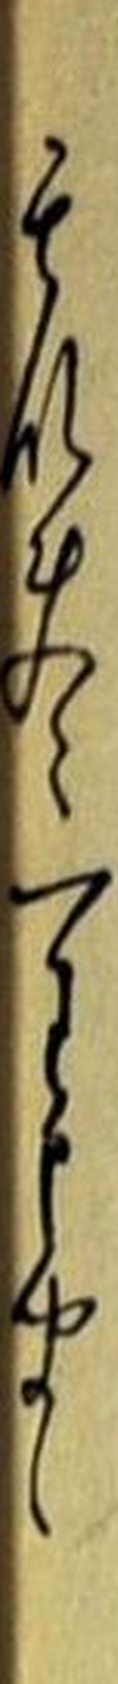其段夫々可被申聞候
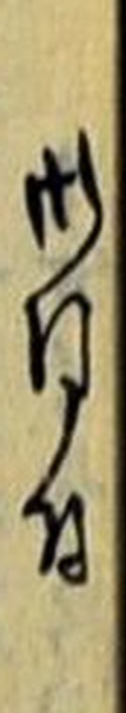御目付
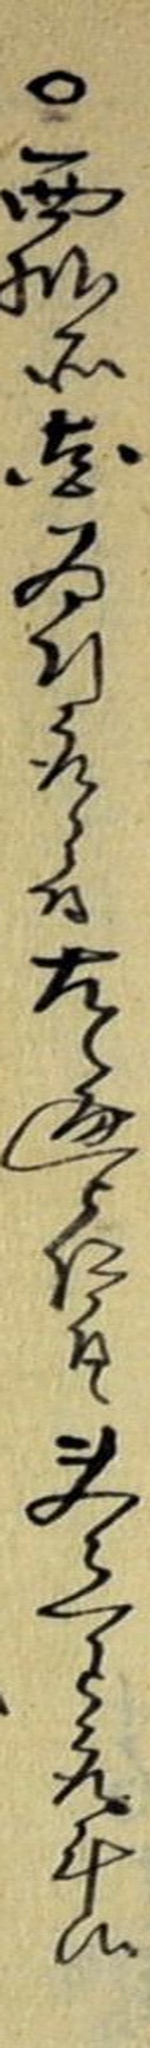○西掛所固為引取候に付左之通被仰付候夫々可被取斗候
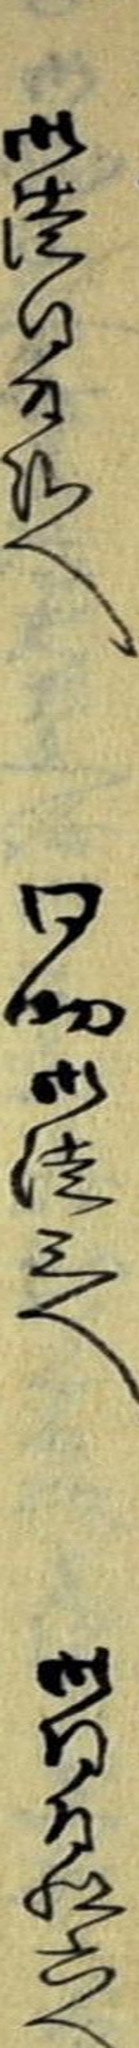御徒目付弐人同助御徒三人御目付組六人
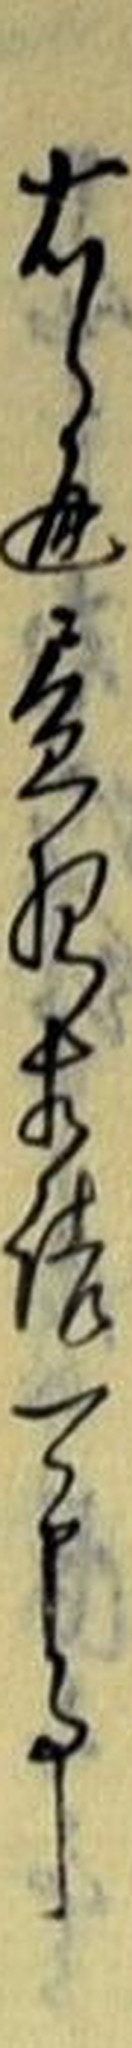右之通昼夜相詰可申事
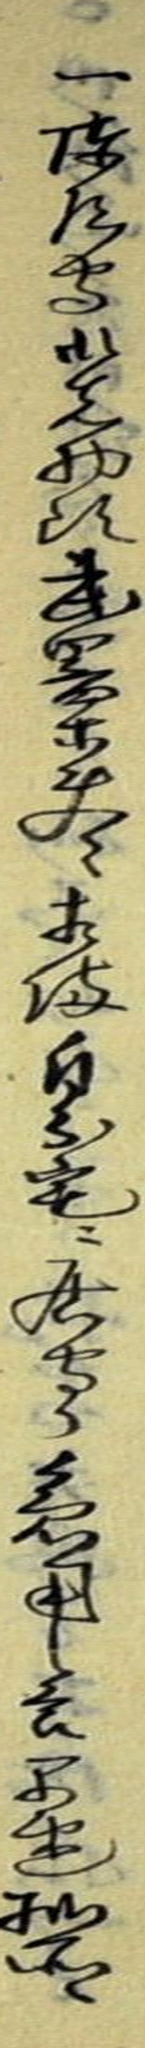一陣屋守御先物頭武器等夫々相備自分宅に居守り急用之節早速掛所へ
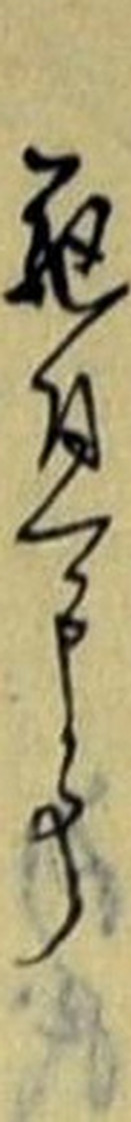駆付可申事
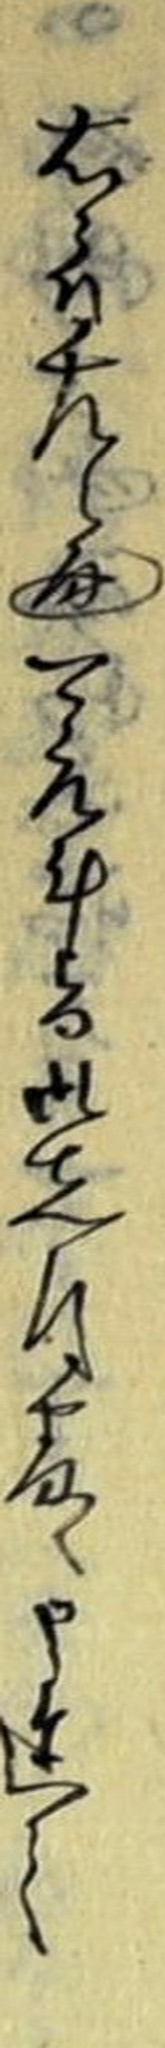右に付左之通可取斗旨御先月番へ申達之
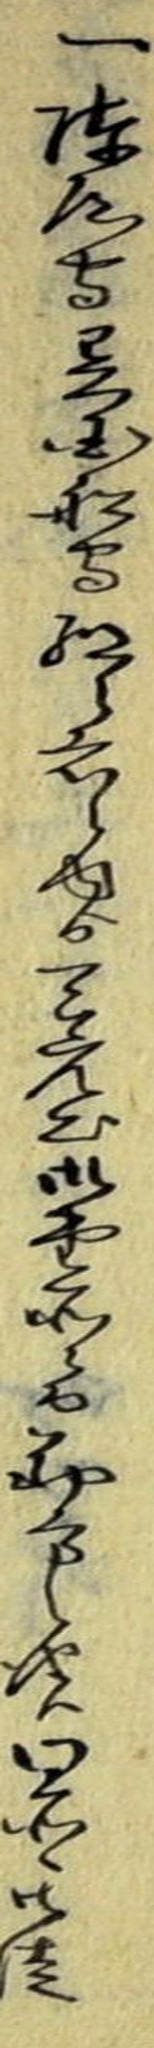一陣屋守異国船守組之者之内ゟ可差出御堂所に而勤方之儀は同所へ御徒
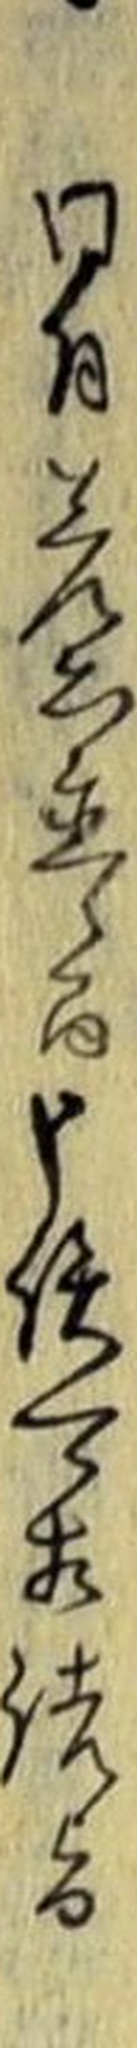目付差出置候間申談可相詰旨
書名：命令之部 四
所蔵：福井県文書館 Fukui Prefectural Archives
